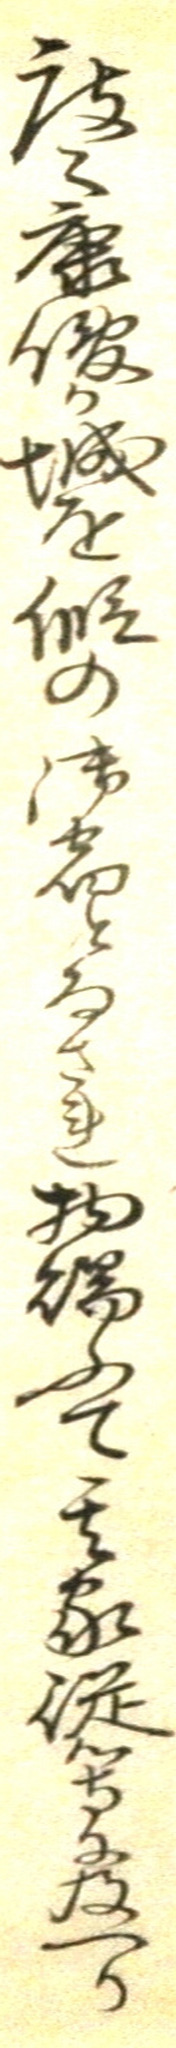度々康俊か城を仮の御宿となされ物賜ふて其家従等に及へり
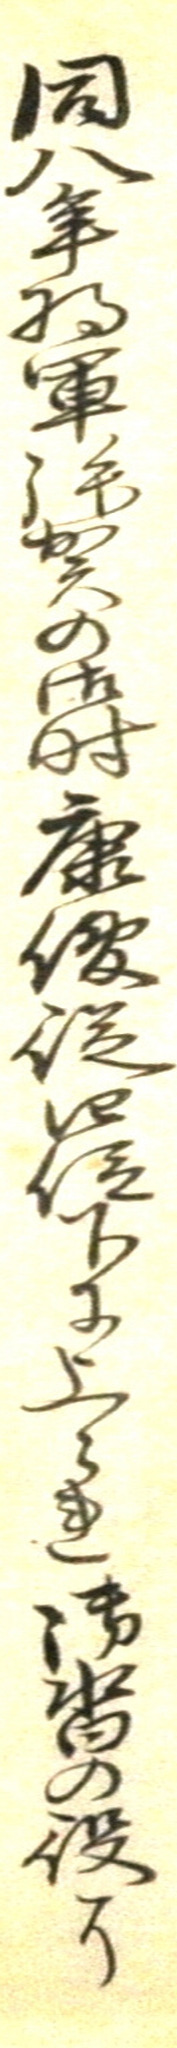同八年将軍拝賀の御時康俊従四位下に上られ御沓の役に
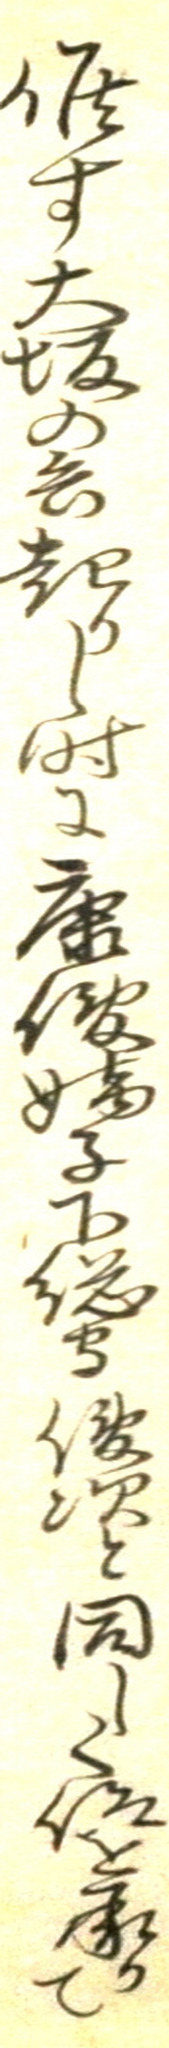候す大坂の兵起りし時に康俊嫡子下総守俊次と同しく仰を承りて
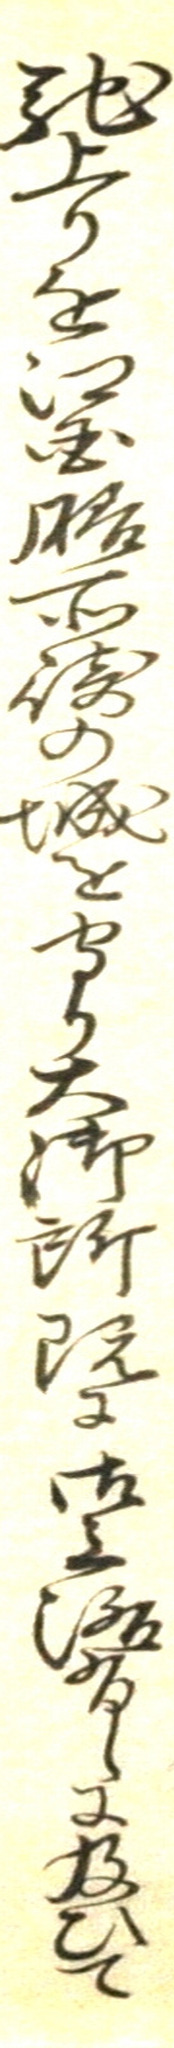馳上り近江国膳所崎の城を守り大御所既に御上洛有しに及ひて
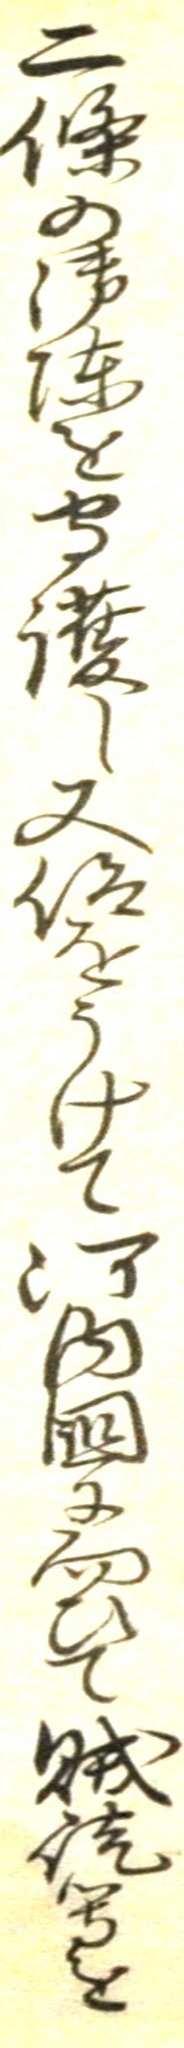二条の御陣を守護し又仰をうけて河内国に向ひて賊徒等を
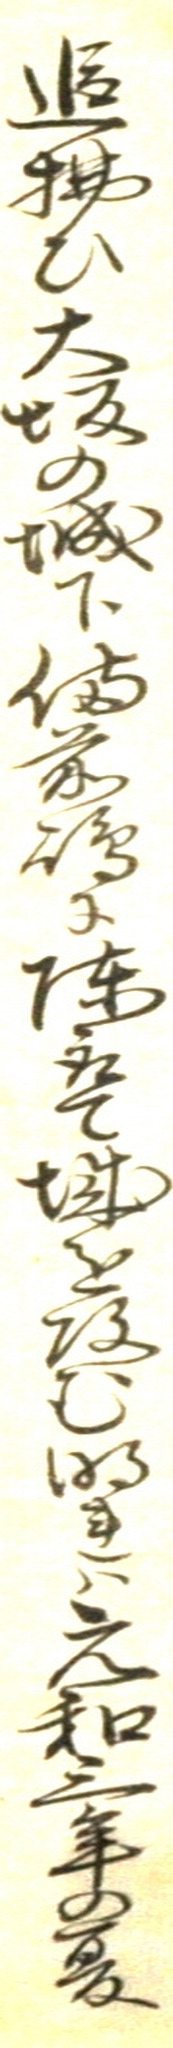追払ひ大坂の城下備前島に陣取て城を攻む明れは元和三年の夏
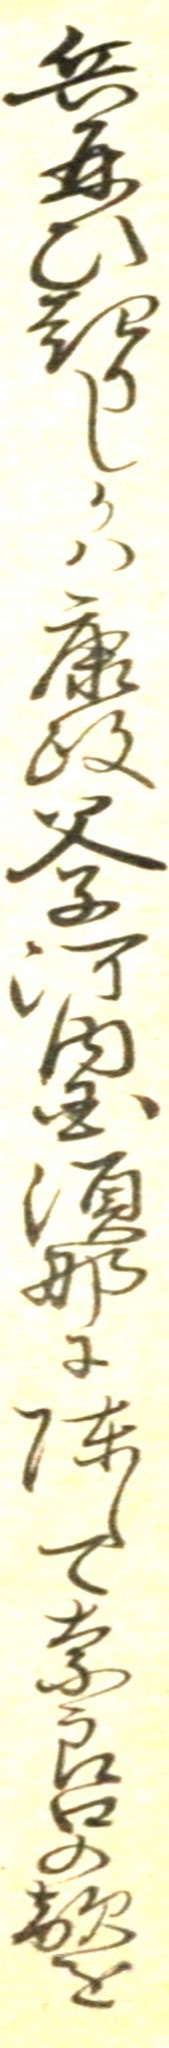兵再ひ起りしかは康政父子河内国須那に陣して奈良口の敵を
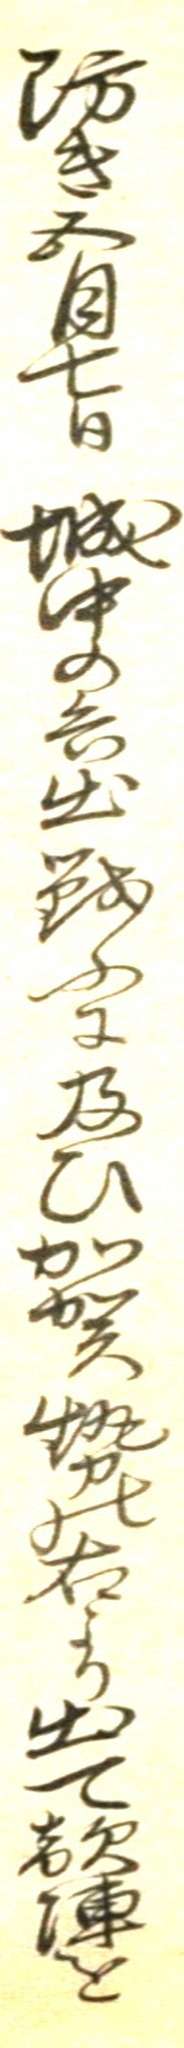防き五月七日城中の兵出戦ふに及ひ加賀勢の右より出て敵陣を
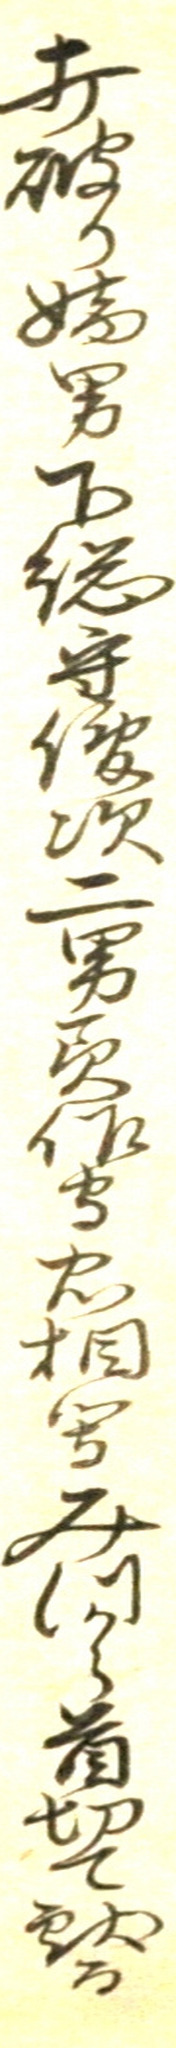打破り嫡男下総守俊次二男美作守忠相等みつから首切て献る
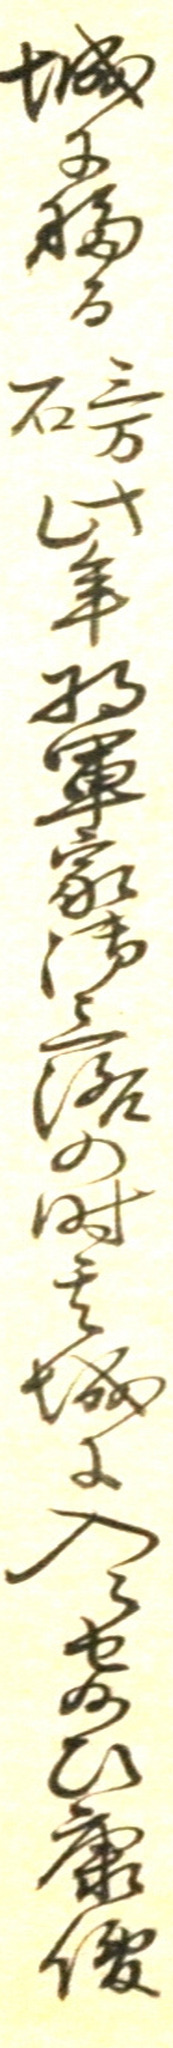城に移る三万石此年将軍家御上洛の時其城に入らせ給ひ康俊
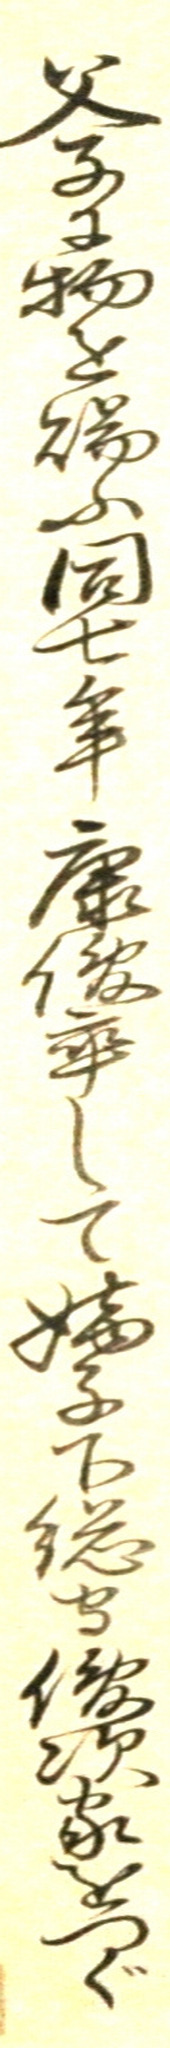父子に物を賜ふ同七年康俊卒して嫡子下総守俊次家をつぐ
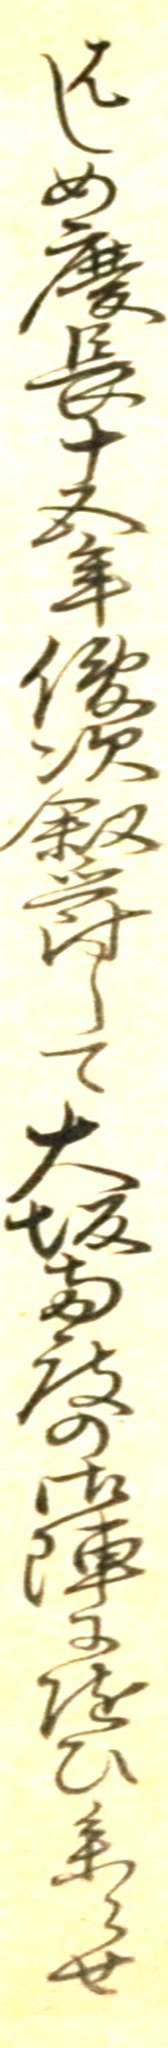はしめ慶長十五年俊次叙爵して大坂両度の御陣に随ひ参らせ
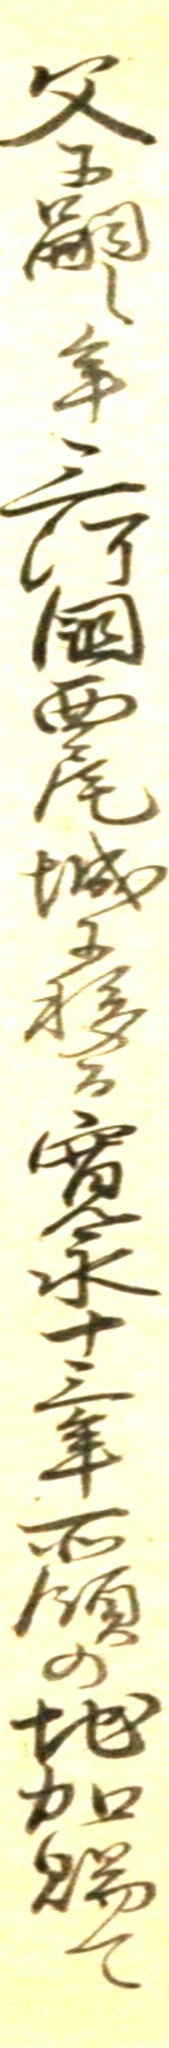父に嗣し年三河国西尾城に移る寛永十三年所領の地加賜て

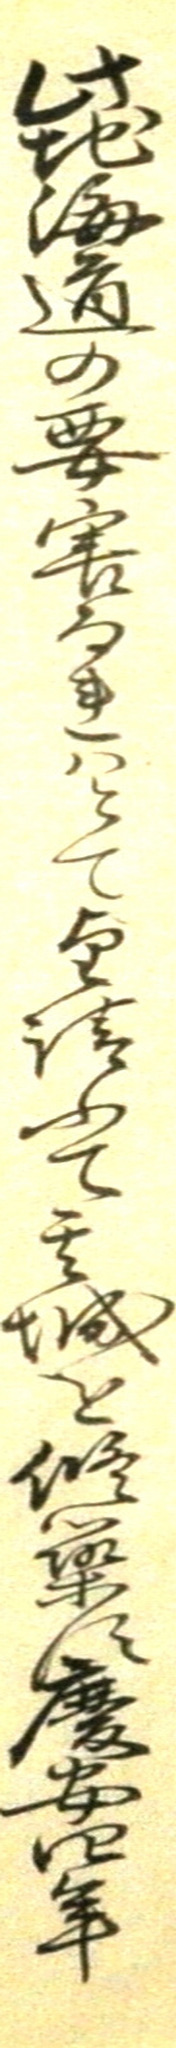此地海道の要害なれはとて望請ふて其城を修築す慶安四年
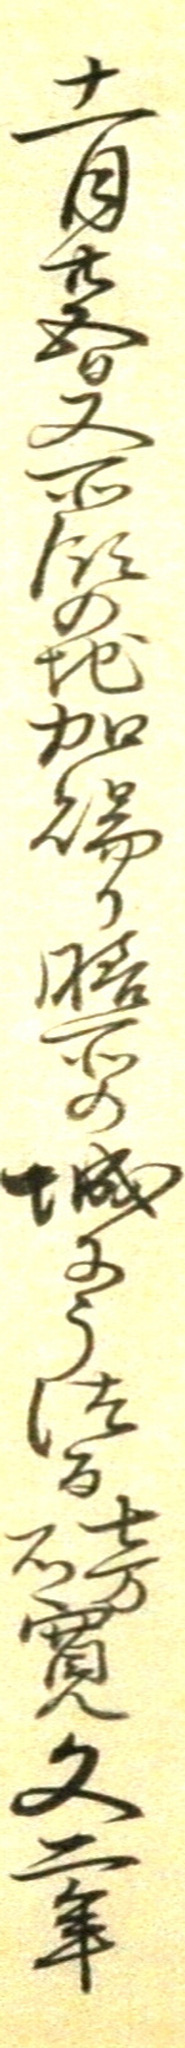十一月廿五日又所領の地加賜り膳所の城にうつる七万石寛文二年
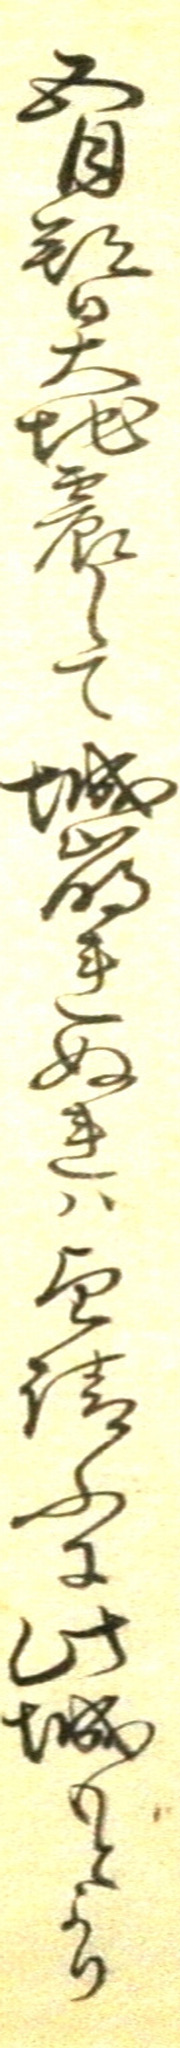五月朔日大地震して城崩れぬれは望請ふに此城もとより
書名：藩翰譜（四・上）
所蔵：伊那市立高遠町図書館・合同会社AMANE
